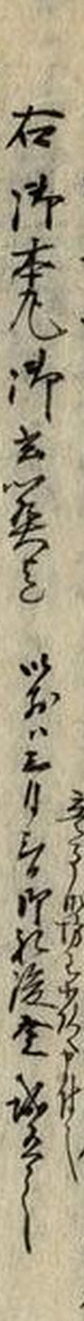右御本丸御玄関迄以前ハ三月三日御礼後登城有之
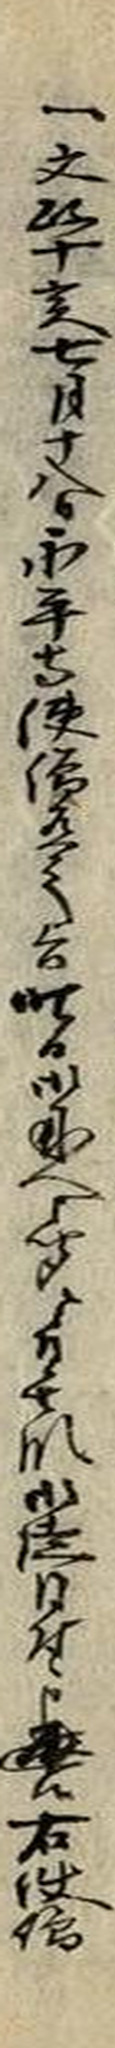一文政十亥七月十八日永平寺使僧有之旨昨日御用人被聞候ニ付其段御徒目付へ申通候右使僧
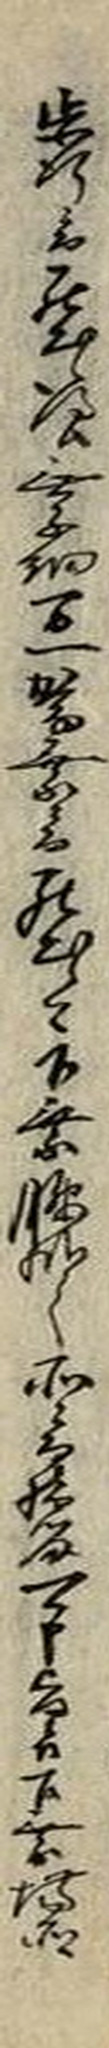歩行ニ而罷出候得共無子細万一駕乗ニ而罷出候ハヽ下乗腰掛之所ニ而指留可申旨ニ付下乗場所へ
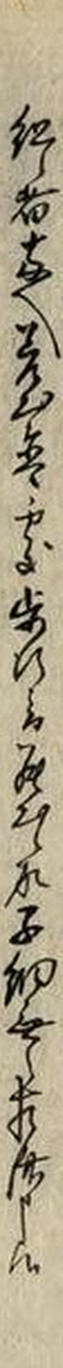組之者両人差出置候処歩行ニ而罷出候故子細無之相済申候
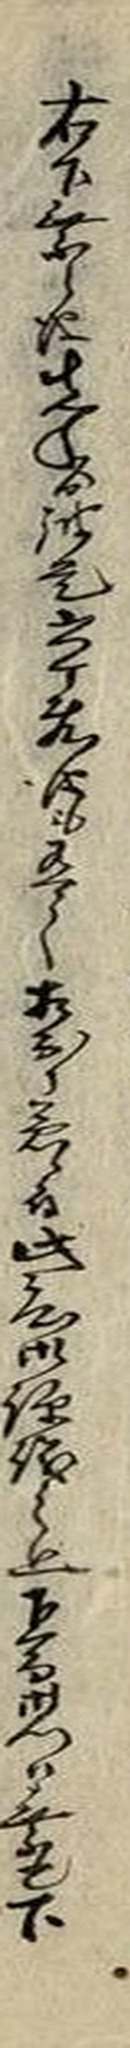右下乗之儀先年ゟ彼是六ケ敷儀も有之相分り兼候ニ付此度御評議之上下馬御門ハ乗込下
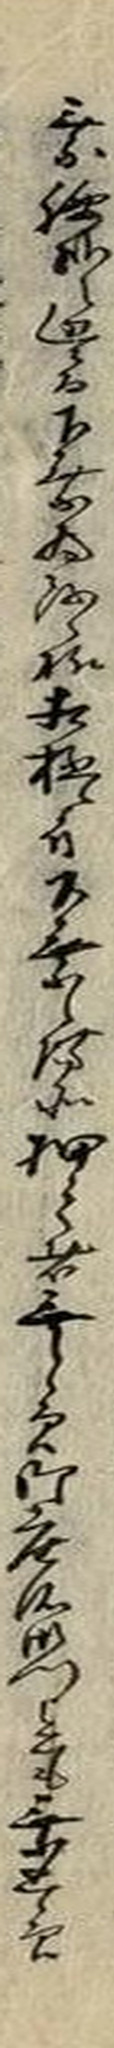乗腰掛之辺ニ而下乗為致候様相極候ニ付下乗之場所押之者無之候而ハ御座所御門迄も乗込候而ハ
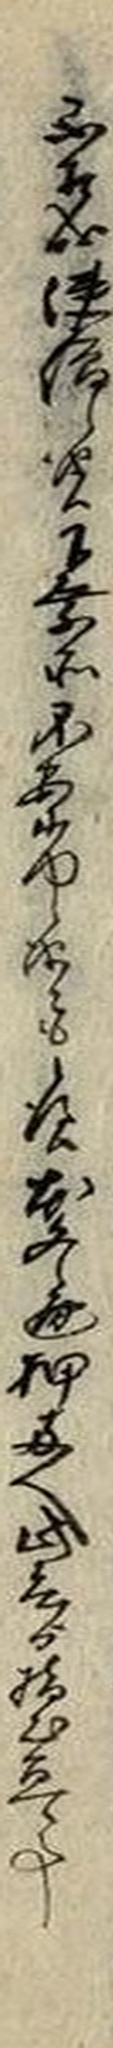不相成使僧之儀ハ下乗所不案内之儀ニも候得共本文之通押両人此度ゟ指出置候事
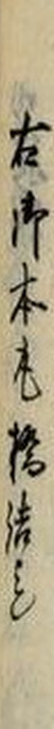右御本丸橋詰迄
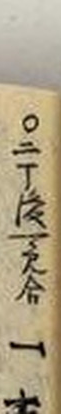〇二丁後可見合
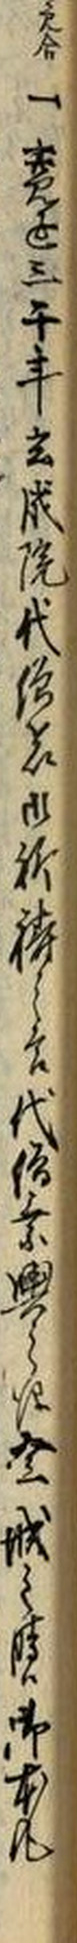一寛延三午年玄成院代僧衆御祈禱之節代僧乗輿之儀登城之時ハ御本丸
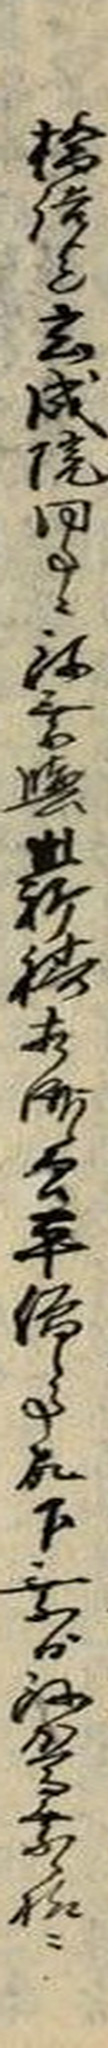橋詰迄玄成院同事ニ致乗輿御祈禱相済候而ハ平僧之事故下乗ゟ致駕乗候様ニ
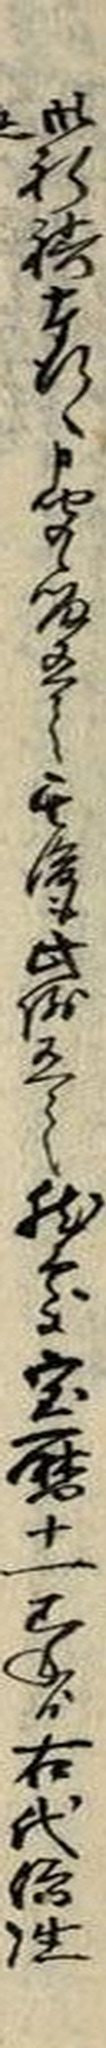御祈禱奉行へ申聞候留有之其後も此例有之然処宝暦十一巳年ゟ右代僧往
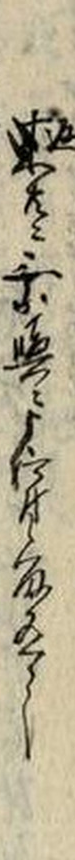返共ニ乗輿ニ被仰付候留有之
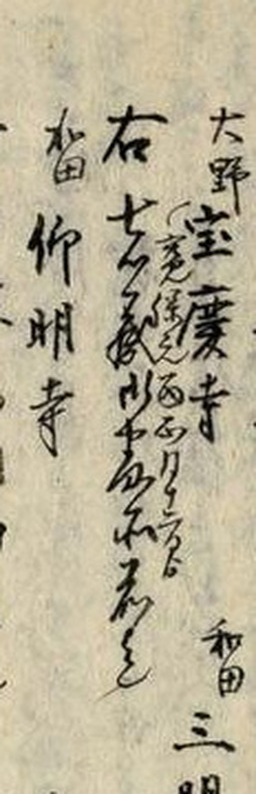右七ツ蔵御番所前迄
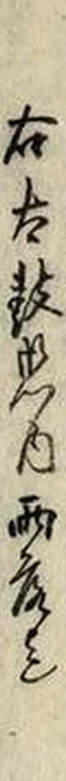右太鼓御門内雨落迄
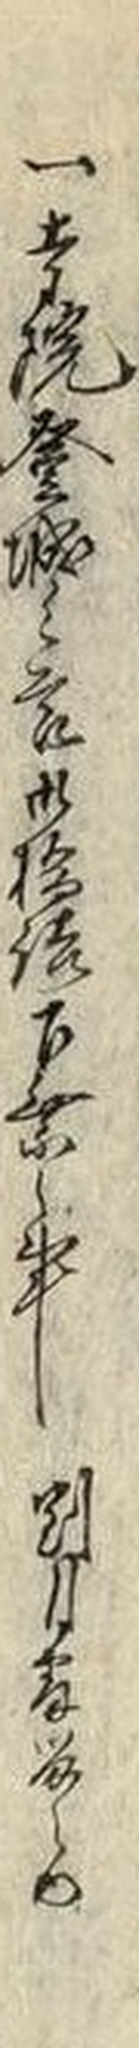一寺院登城之節御橋詰下乗之事割月番留之内
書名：御国他国諸事之部
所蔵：福井県文書館 Fukui Prefectural Archives
